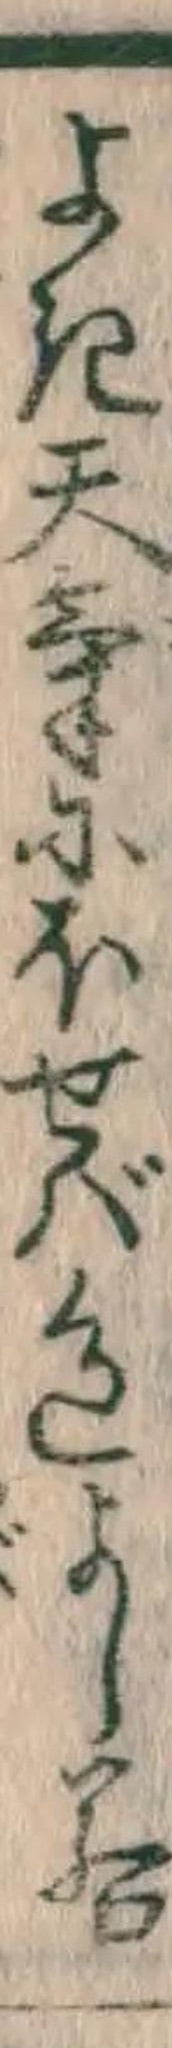よき天気にほせば色よし若
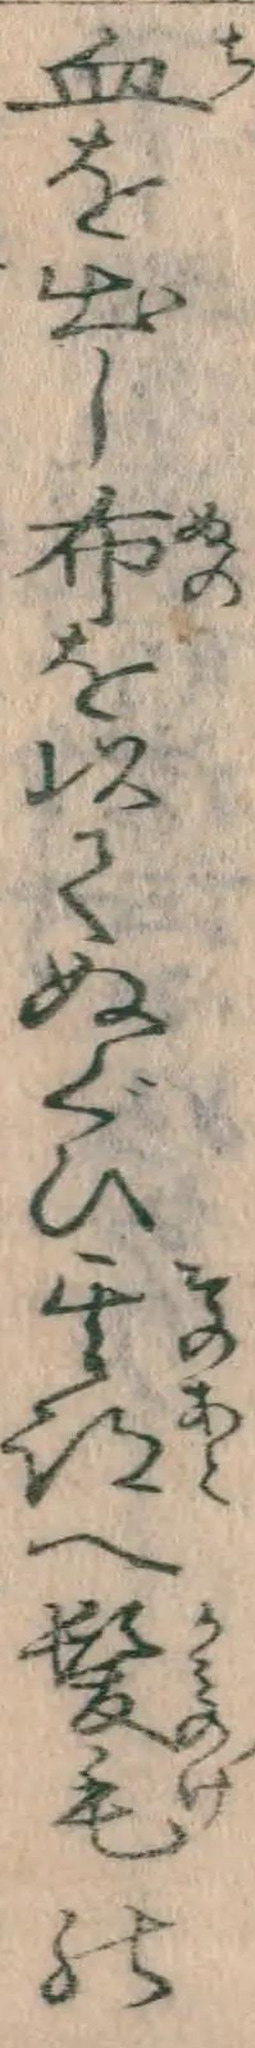血を出し布を以てぬぐひ其後へ髪毛の
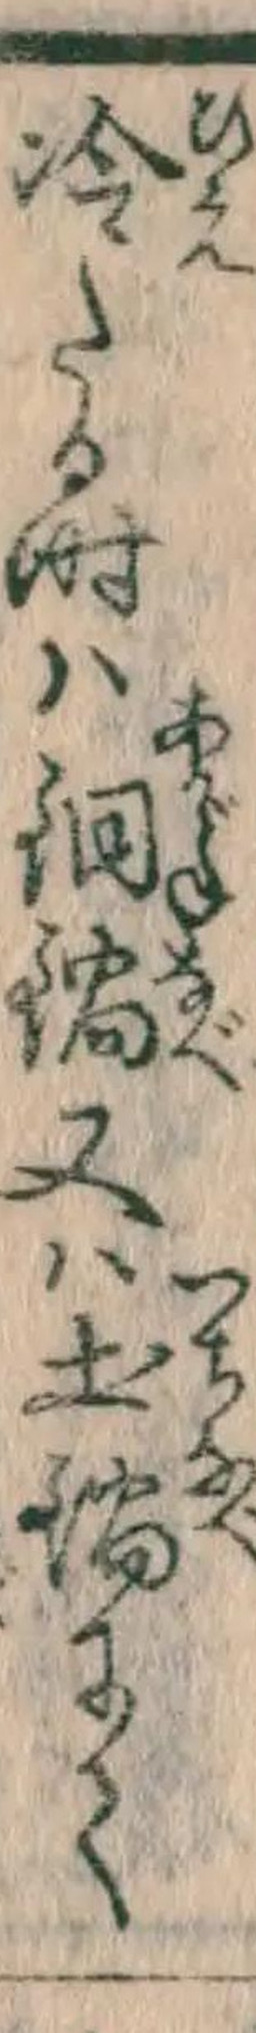冷たる時は銅鍋又は土鍋にて
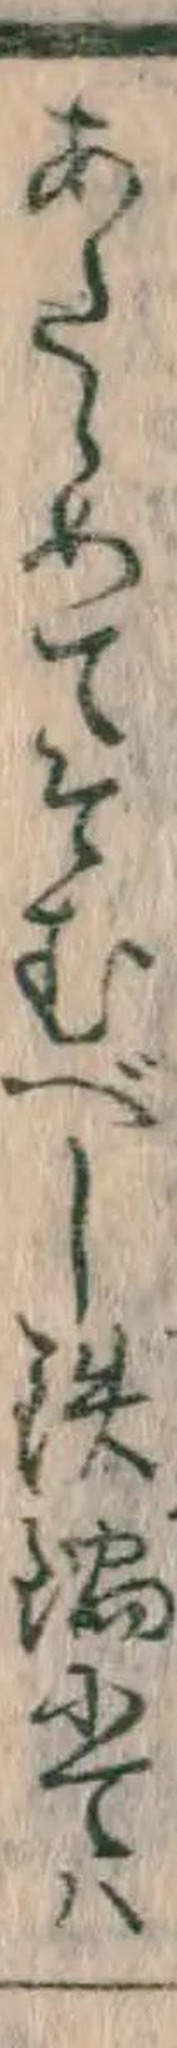あたゝめてそむべし鉄鍋にては
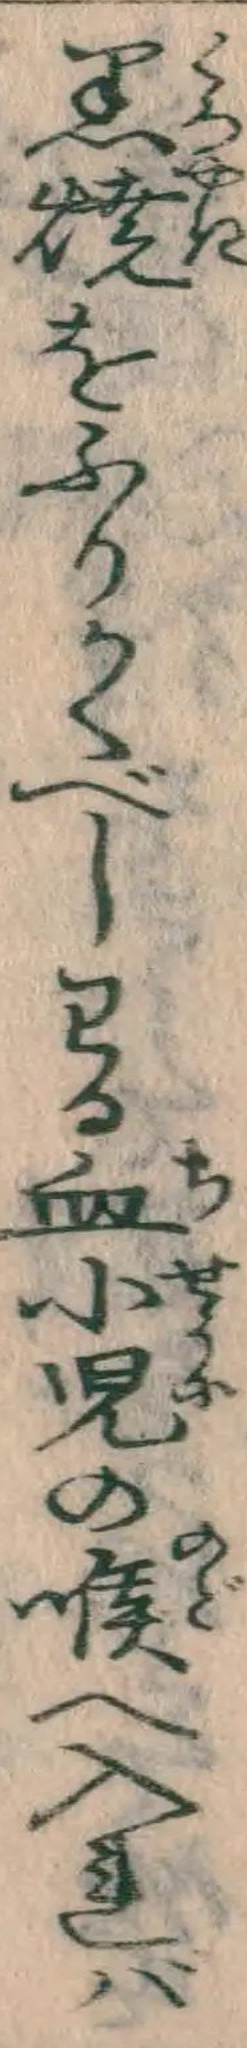黒焼をふりかくべしわる血小児の喉へ入れば
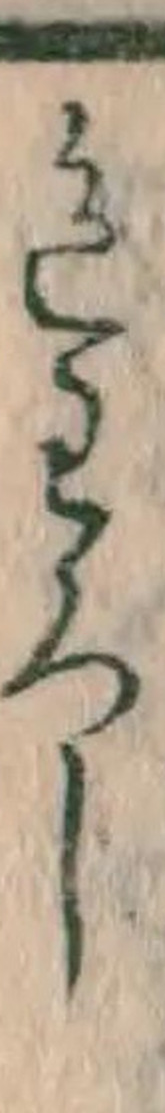色わろし
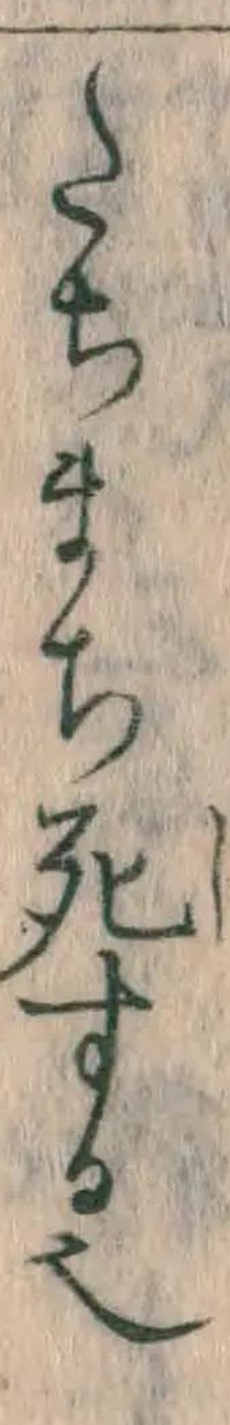たちまち死する也
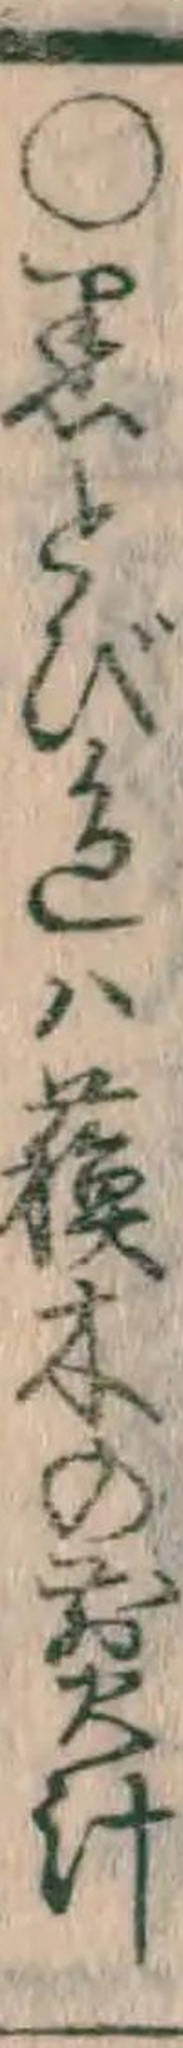○黒とび色は蘓木の煎汁
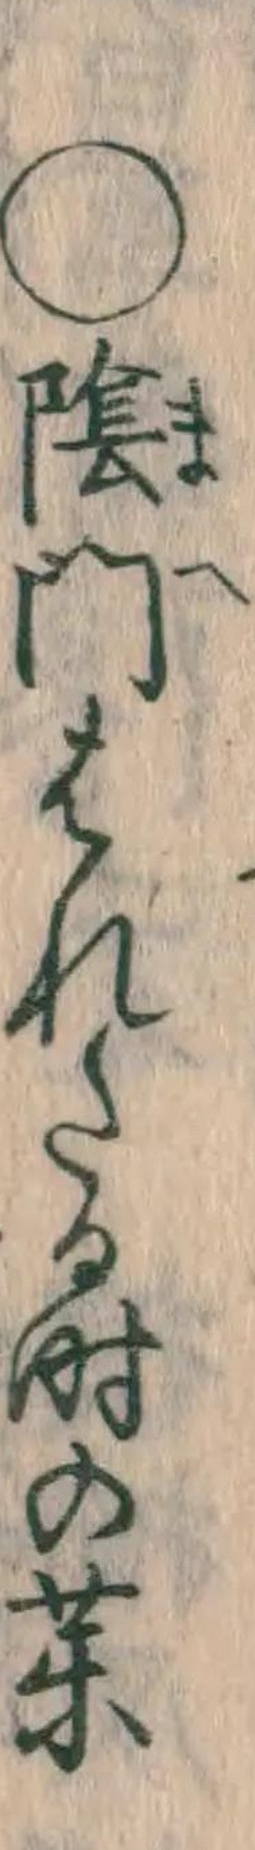○陰門はれたる時の薬
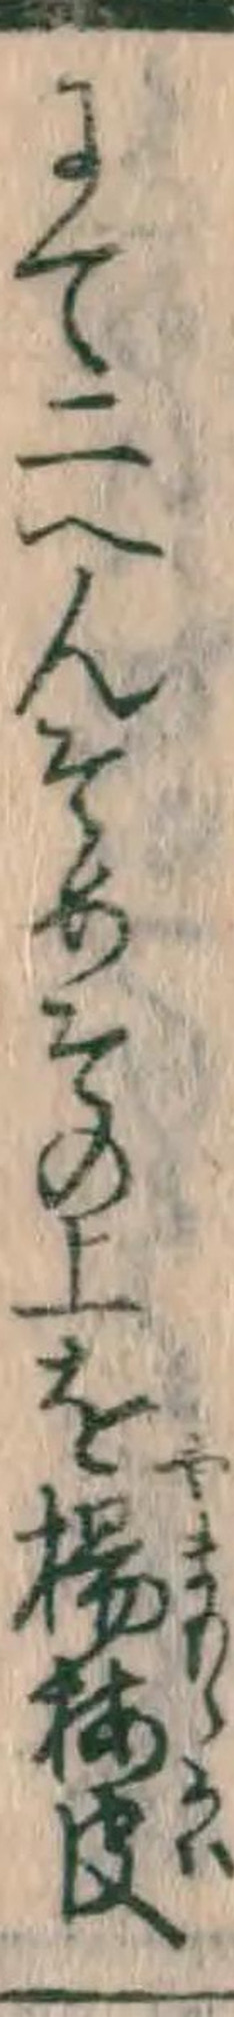にて二へんそめその上を楊梅皮
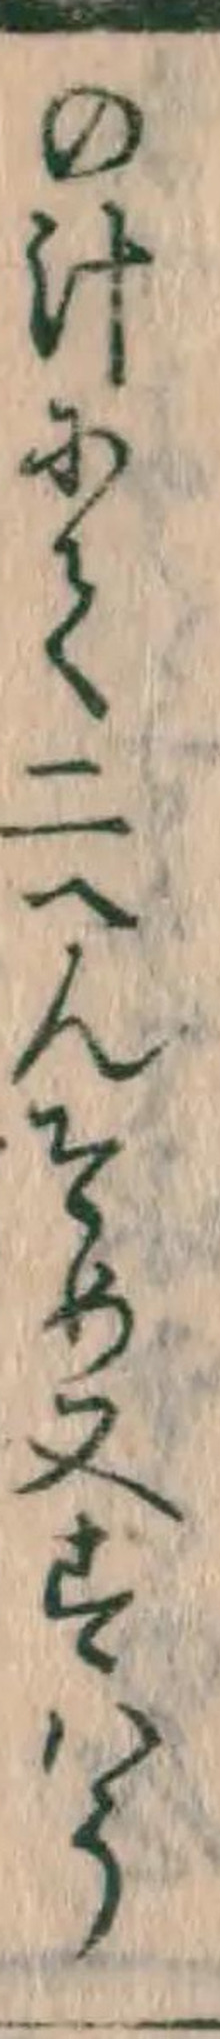の汁にて二へんそめ又すはう
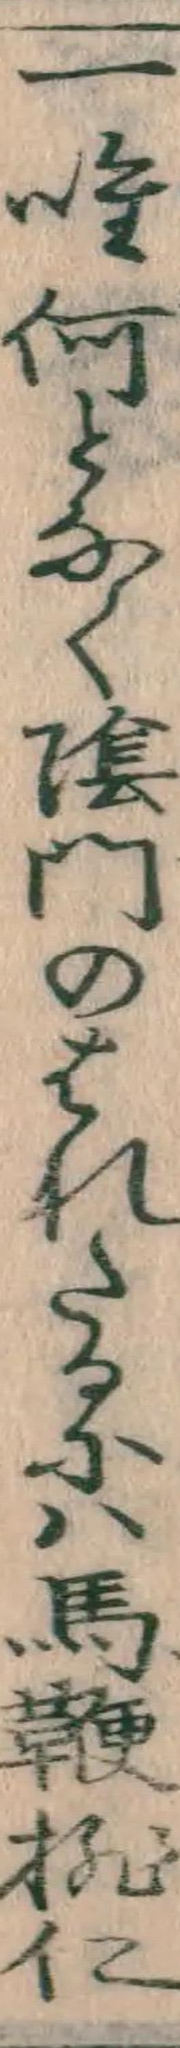一唯何となく陰門のはれたるには馬鞭桃仁
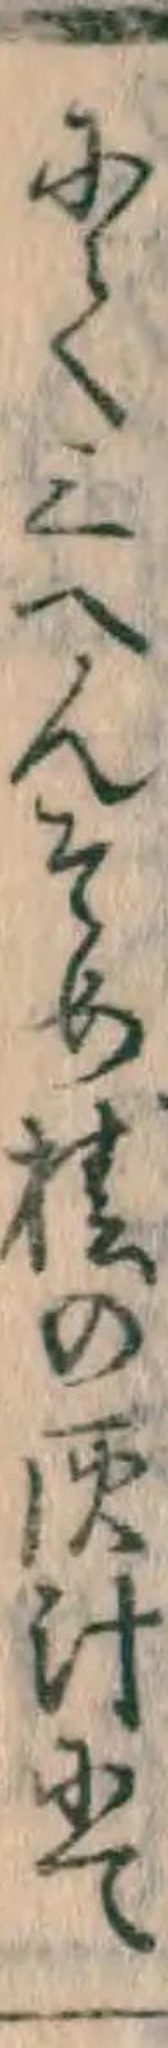にて三へんそめ椿の灰汁にて
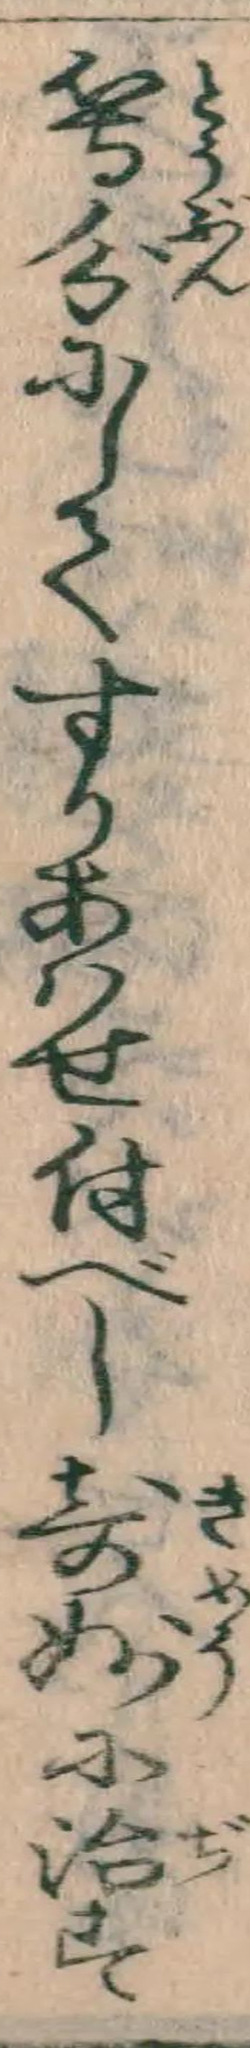等分にしてすりあはせ付べし奇妙に治す
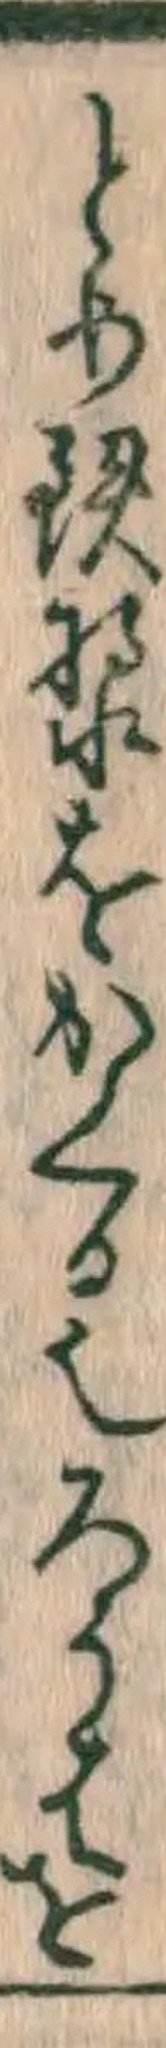とめ鉄漿をかくる也ろうはを
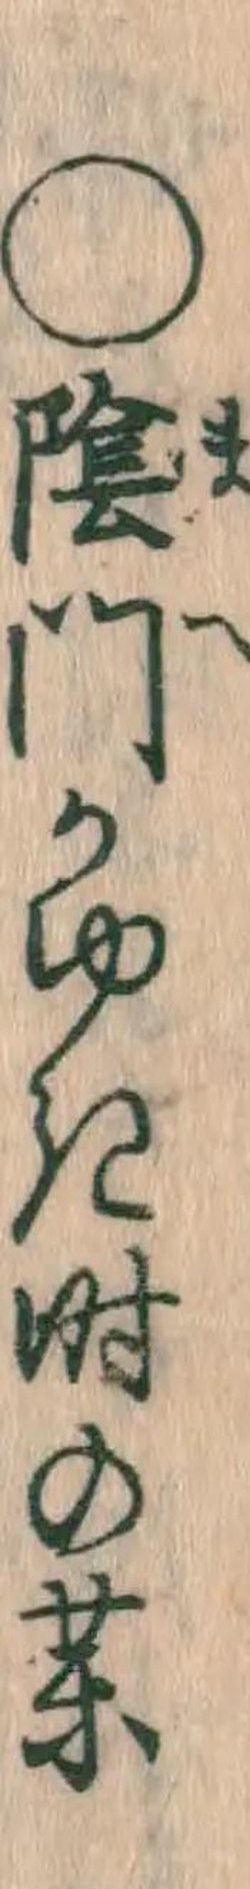○陰門かゆき時の薬
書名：広益秘事大全 3巻. [3]
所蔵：国立国会図書館 National Diet Library, JAPAN
